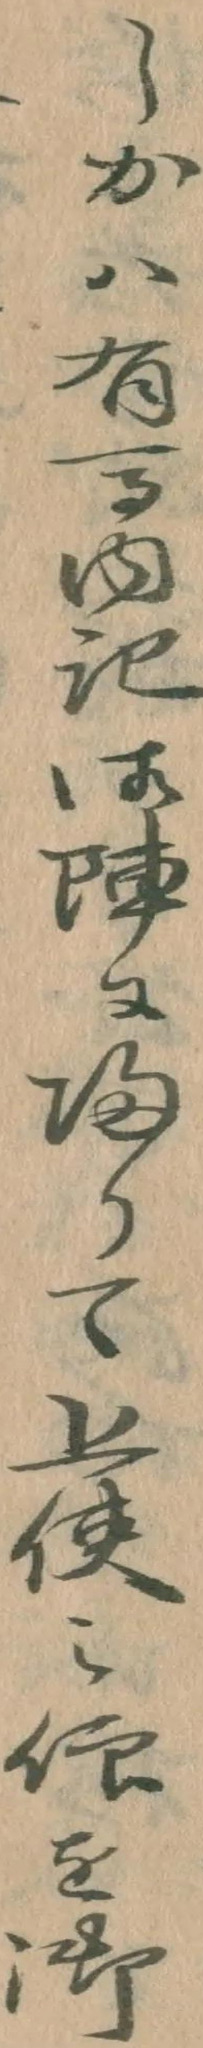しかは有馬内記御陣尓帰りて上使之仰を御
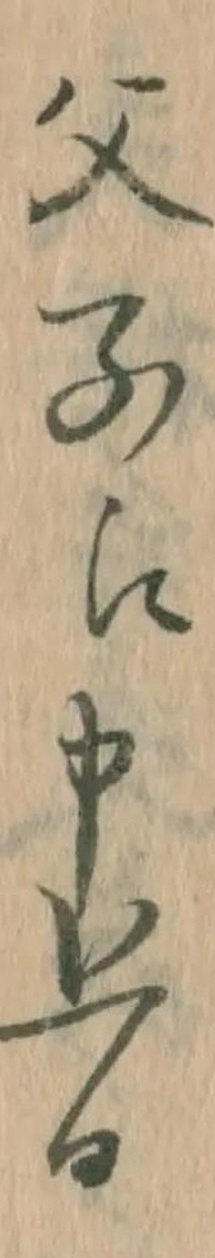父子江申上る
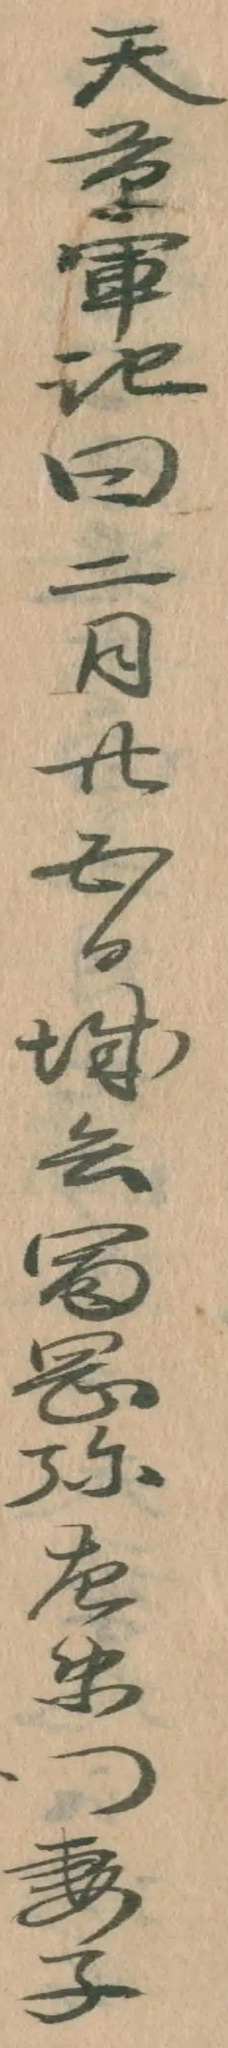天草軍記曰二月廿五日城兵冨岡弥左衛門妻子
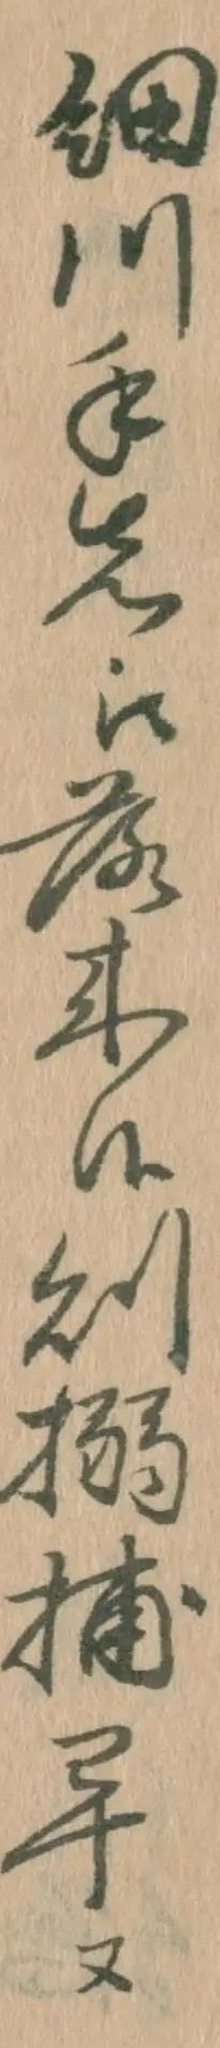細川手先江落来候則搦捕畢ぬ
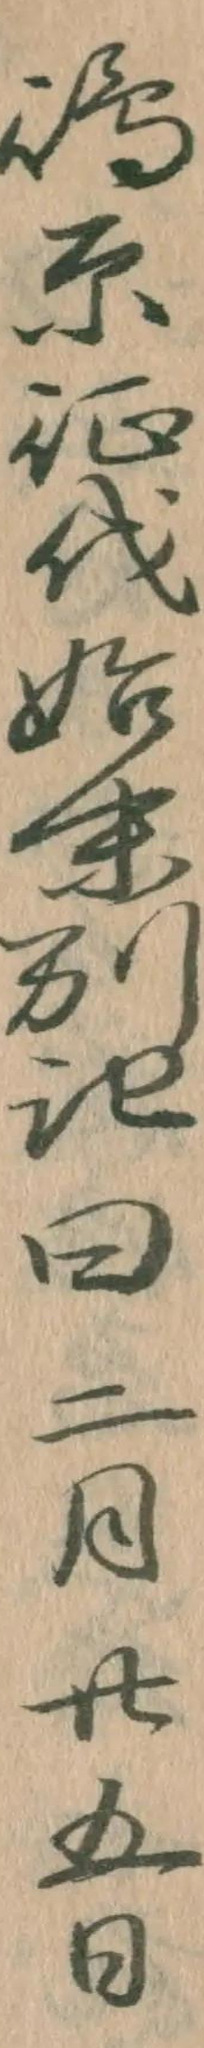島原征伐始末別記曰二月廿五日
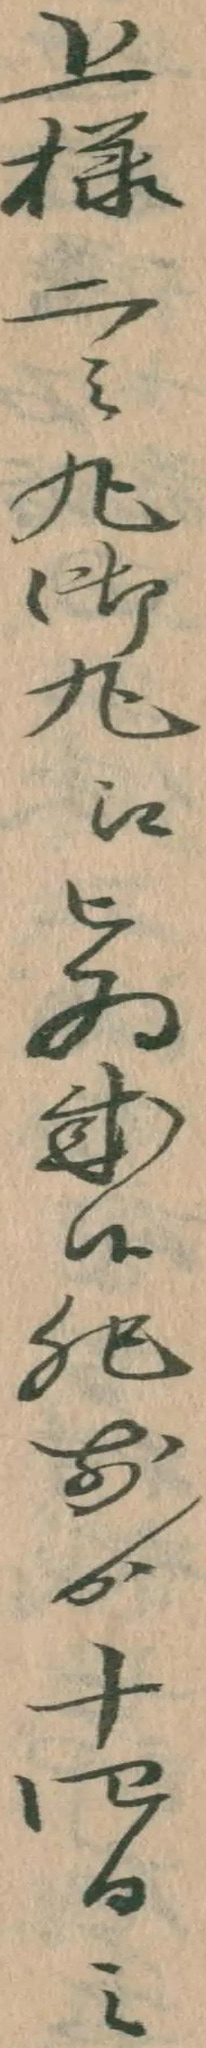上様二之丸御丸江被ゐ成候肥前ゟ十四日之
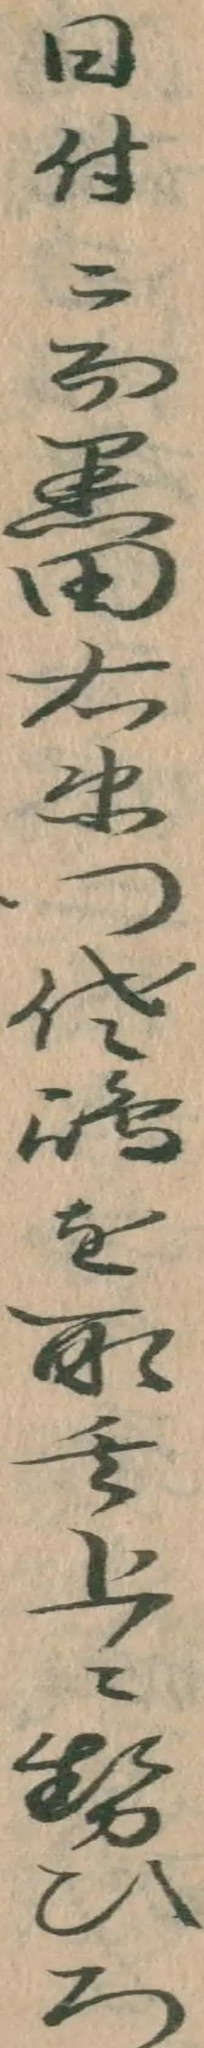日付に而黒田右衛門佐島を取其上に勢ひろ
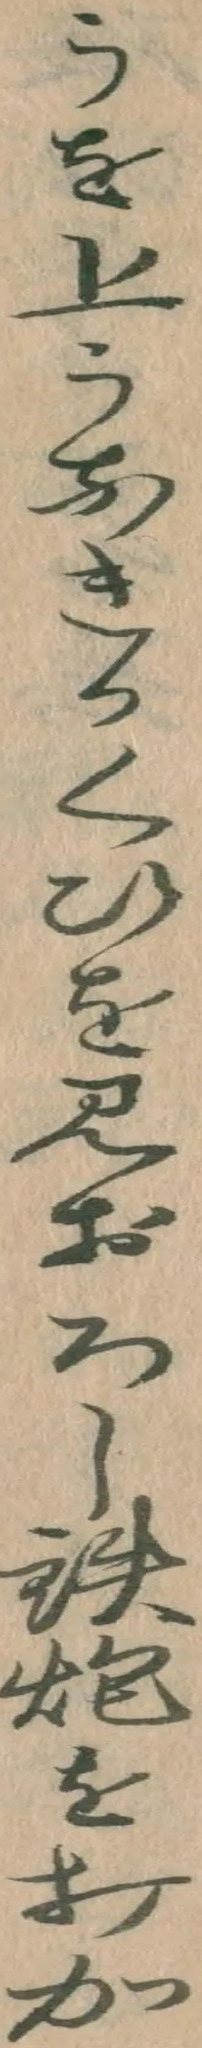うを上うなきかくひを見おろし鉄炮を打加
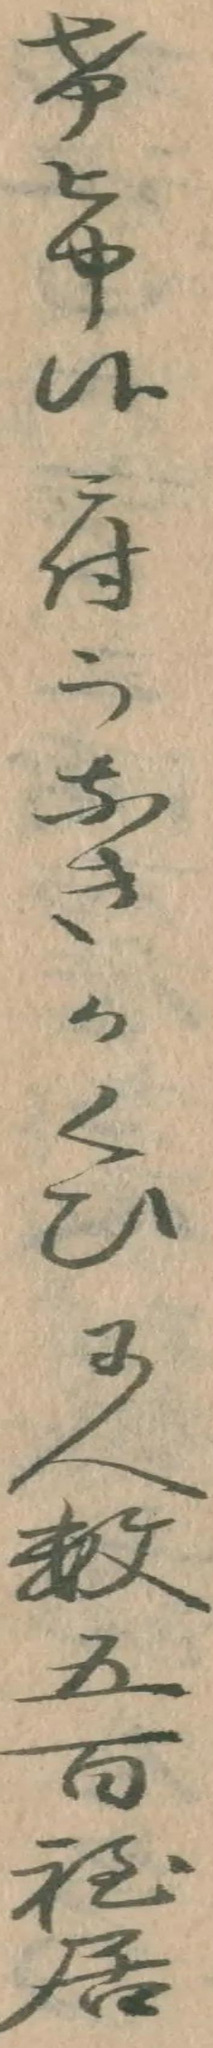希被申候に付うなきかくひ尓人数五百程居
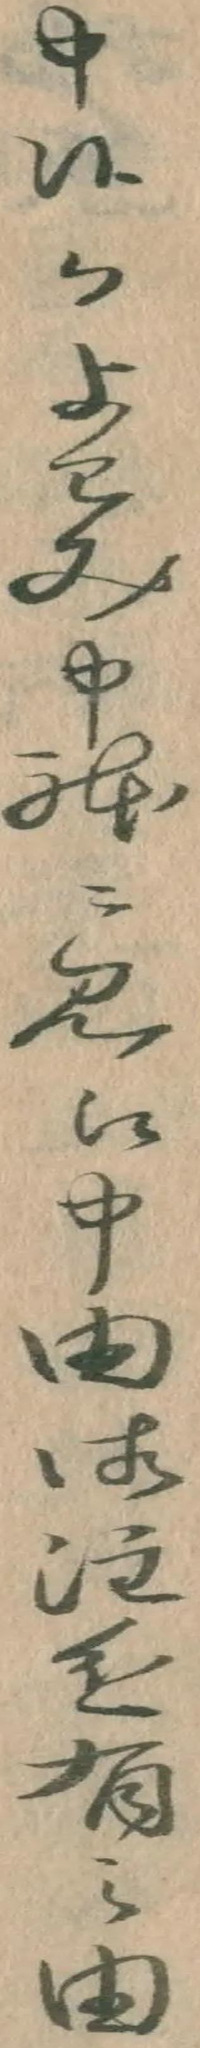申候かよわみ申躰に見江申由御注進有之由
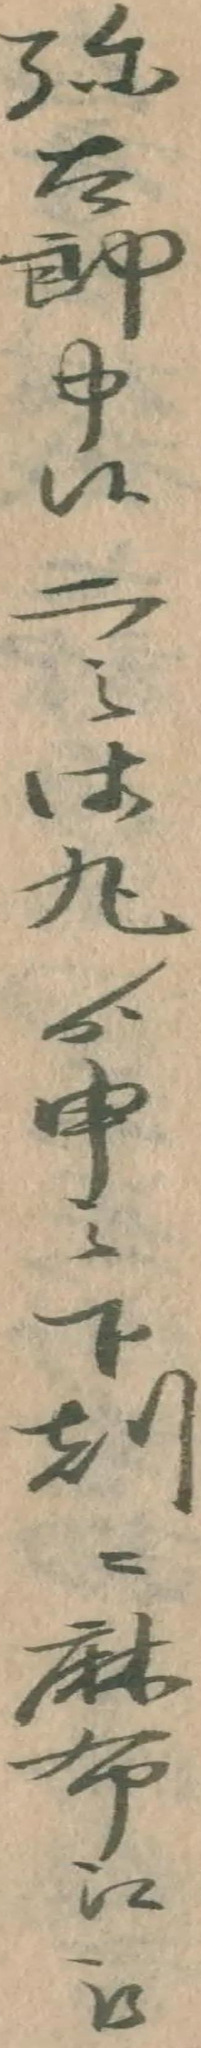弥太郎申候二之御丸ゟ申之下刻に麻布江被
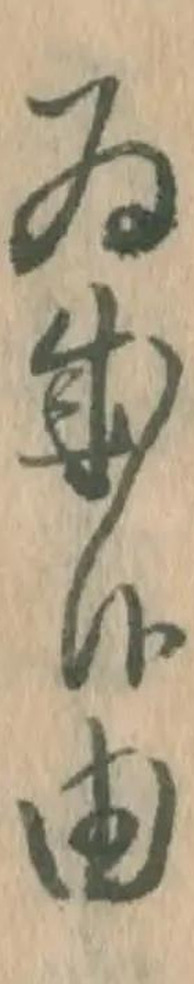ゐ成候由
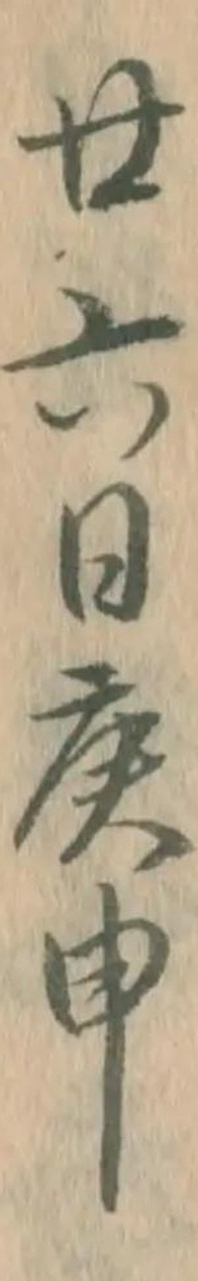廿六日庚申

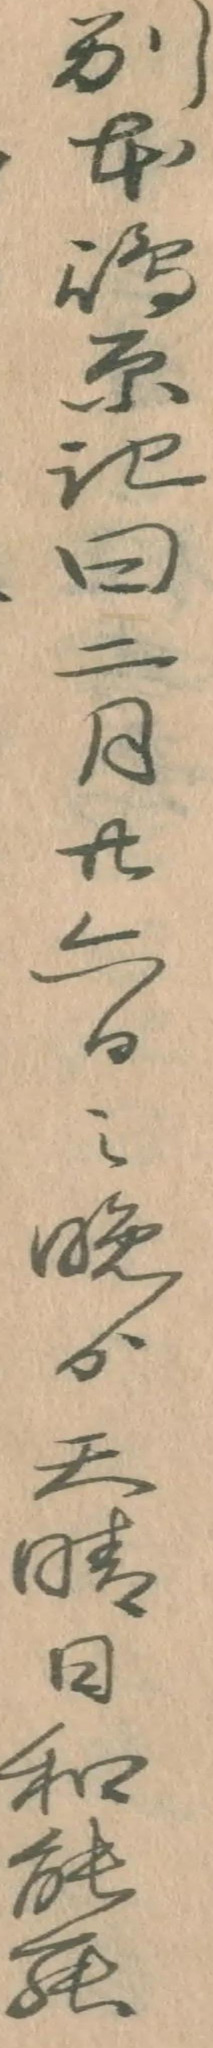別本島原記曰二月廿六日之晩ゟ天晴日和能罷
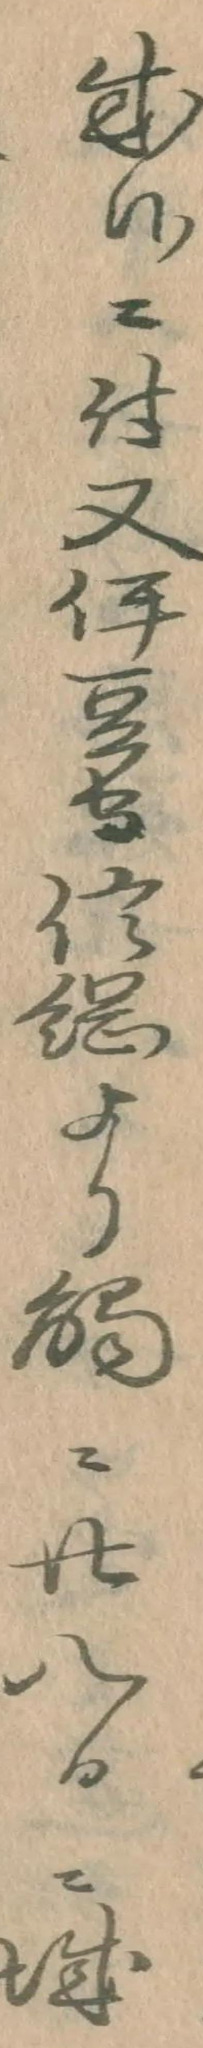成候に付又伊豆守信綱より触に廿八日に城
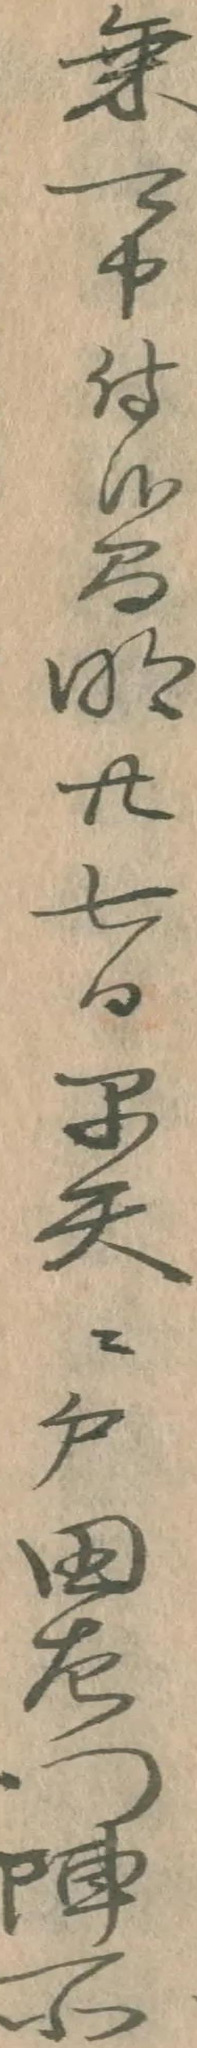乗可申付候間明廿七日早天に戸田左門陣所
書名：切支丹御退治記 49巻. [7]
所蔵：国立国会図書館 National Diet Library, JAPAN
